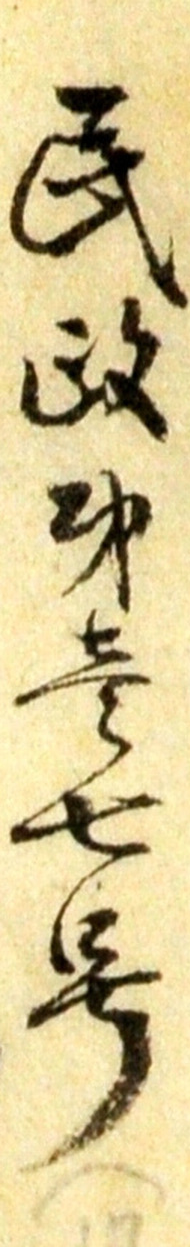民政第壱七号
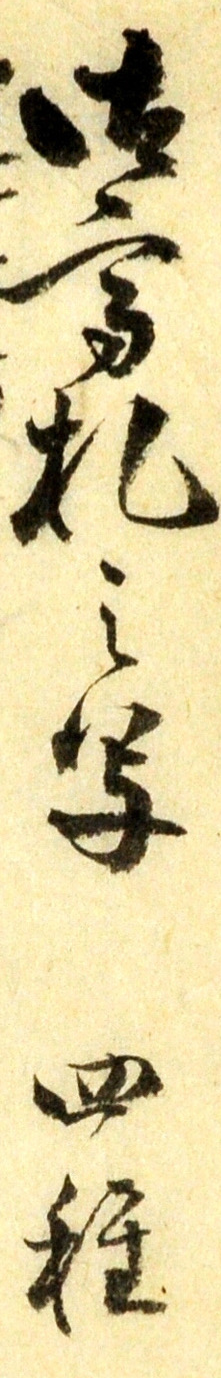御高札之写四種
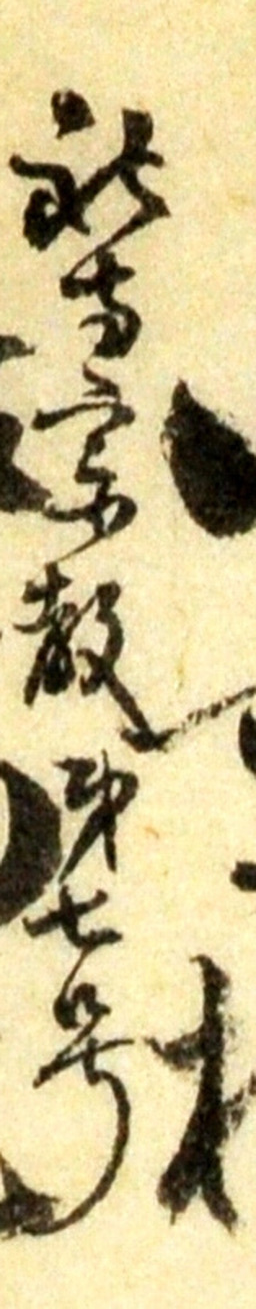社寺宗教第七号
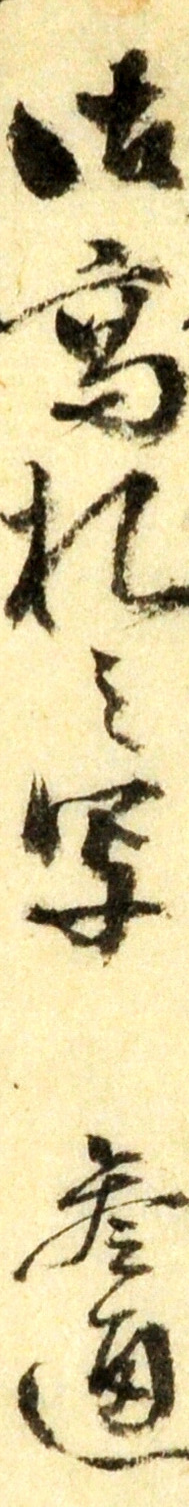御高札之写参遍
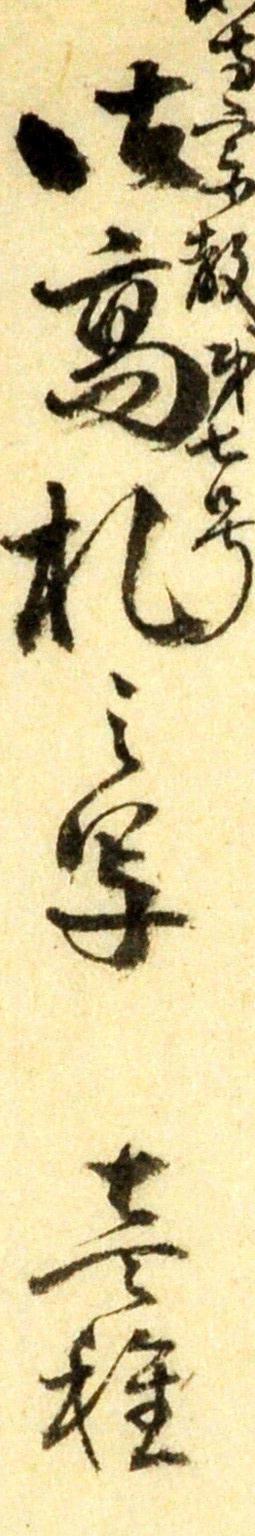御高札之写壱種
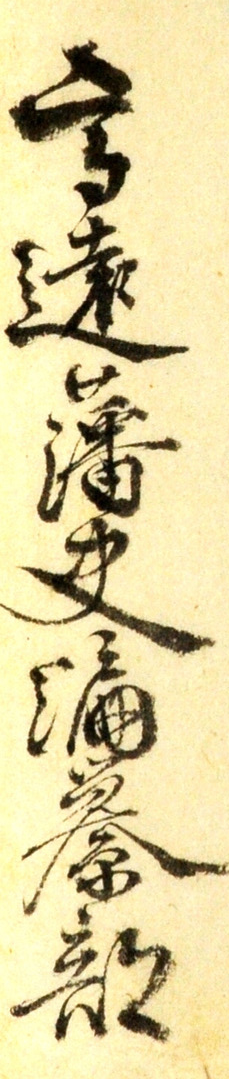高遠藩史編纂部

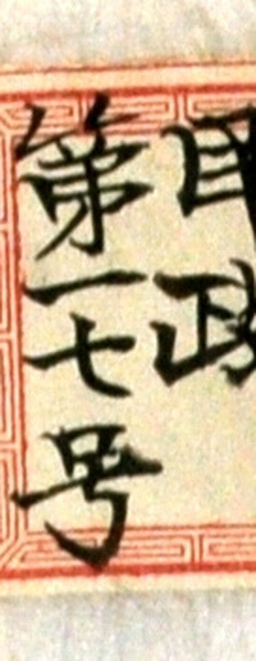第一七号
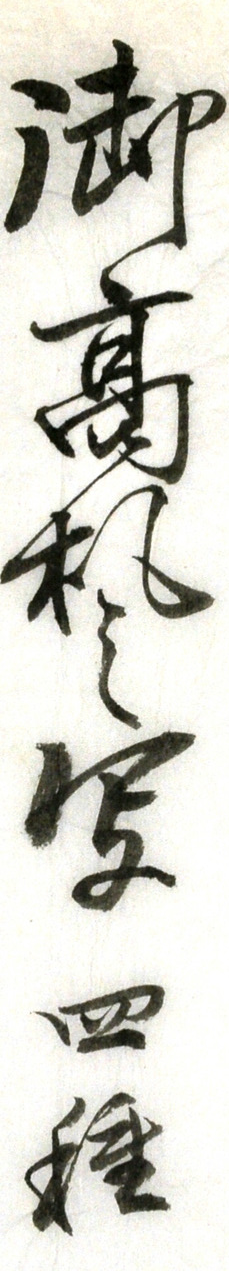御高札之写四種

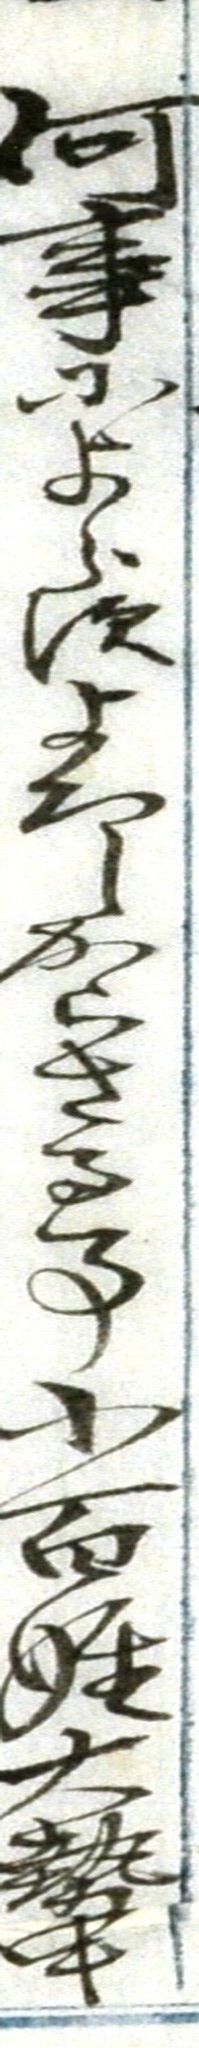一何事によらずよろしからざる事小百姓大勢申
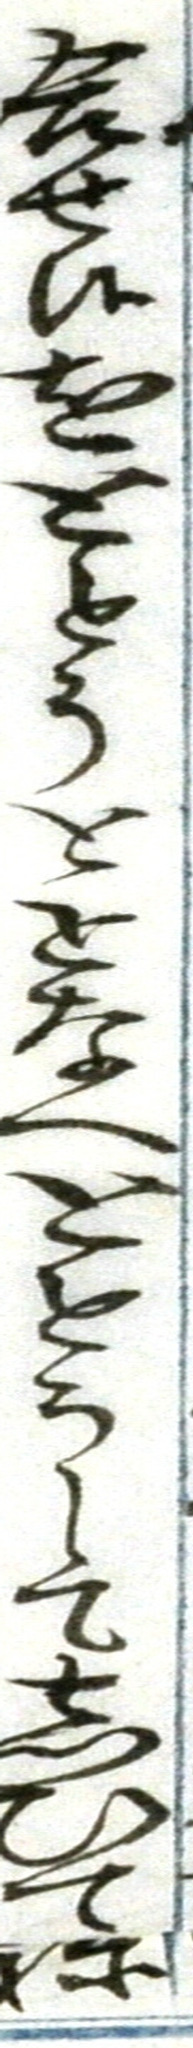合せ候をととうととなへととうしてしひてね
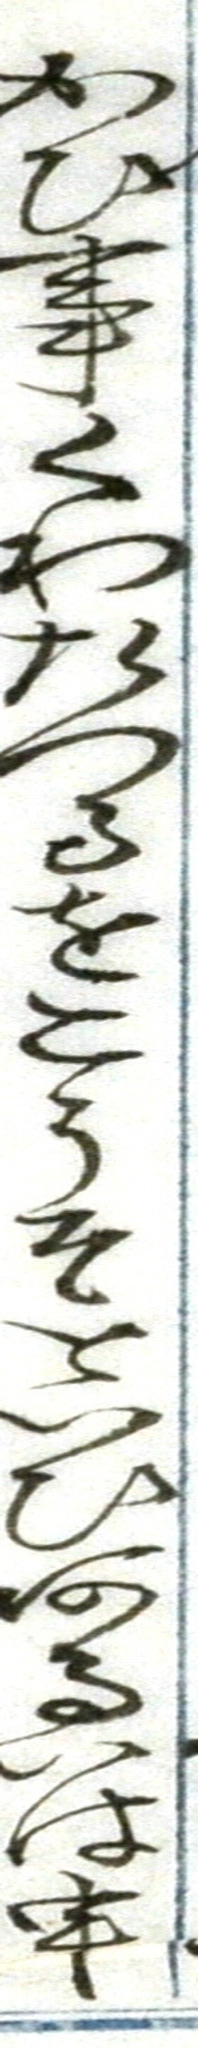かひ事くわだつるをこうそといひあるいは申
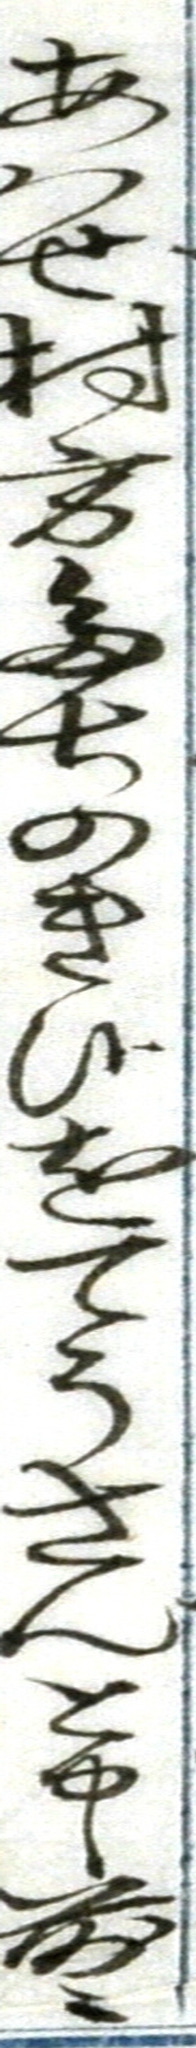あはせ村方多ちのき候をてうさんと申前々
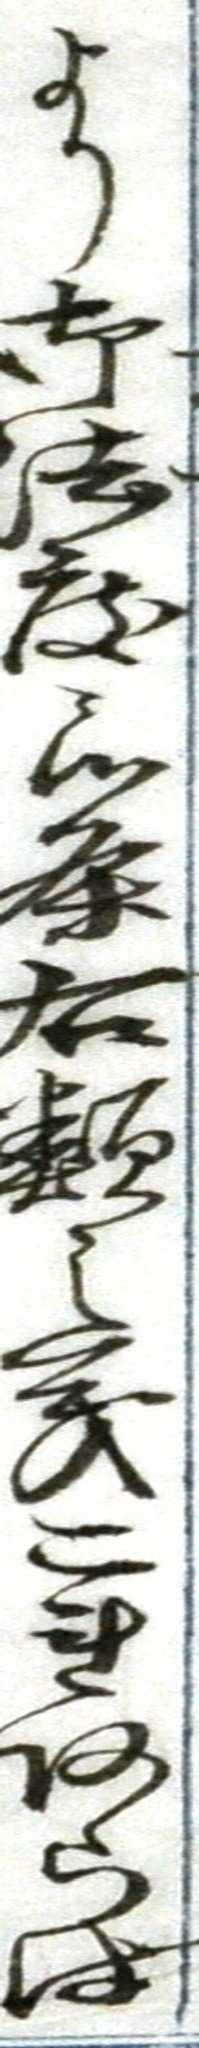より御法度に候条右類之義これあらは
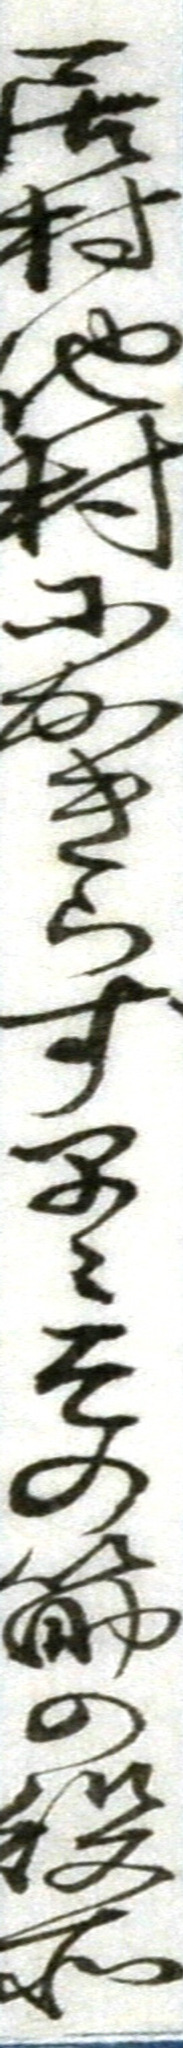居村他村にかきらす早々その筋の役所
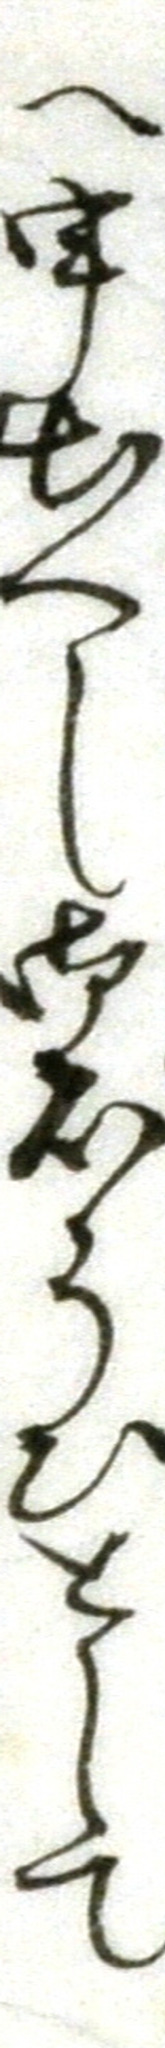へ申出へし御ほうひとして
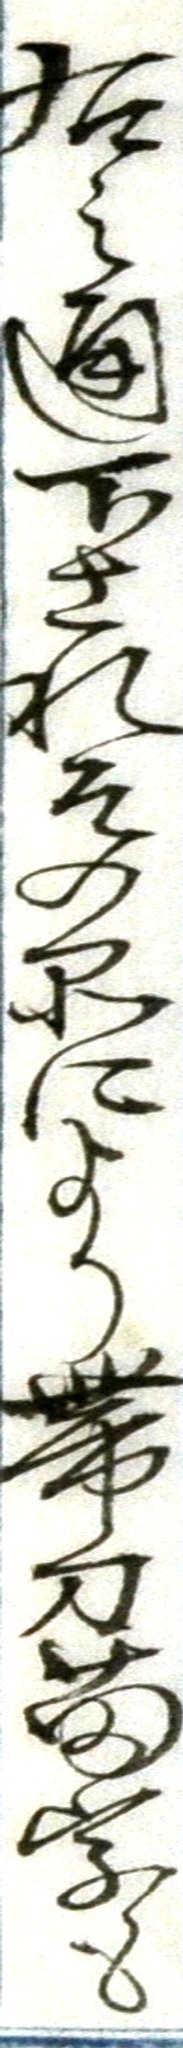右之通下されその品により帯刀苗字も
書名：御高札之写
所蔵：伊那市立高遠町図書館・合同会社AMANE
